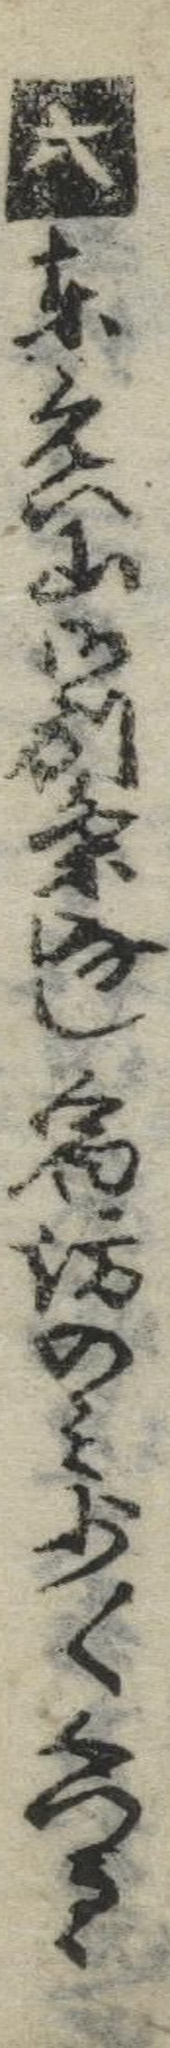六東えい山御別条なし宿坊のミ少々くつるゝ
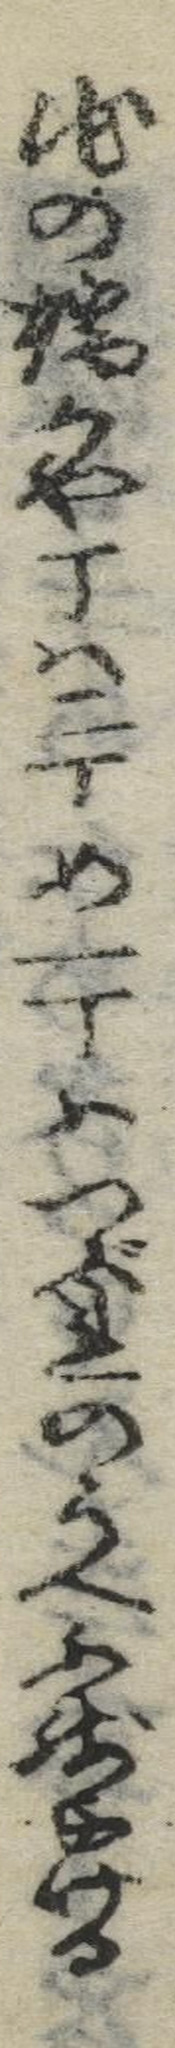池の端かや丁ハ二丁め一丁めつぶれのうへ不残やける
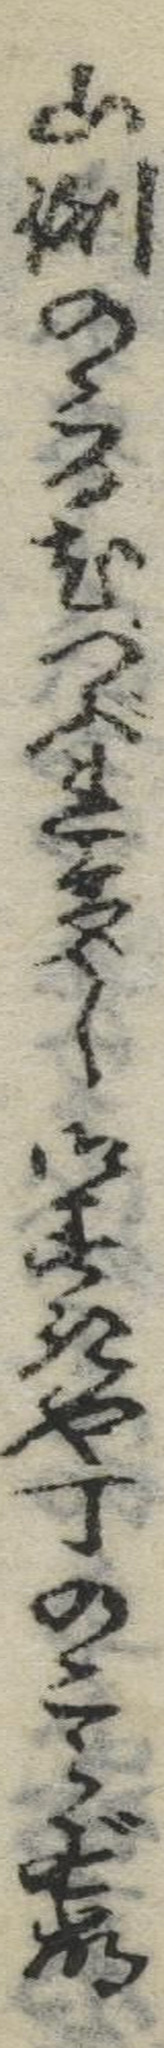山側のこる尤つぶれ多し御すきや丁のこらず崩
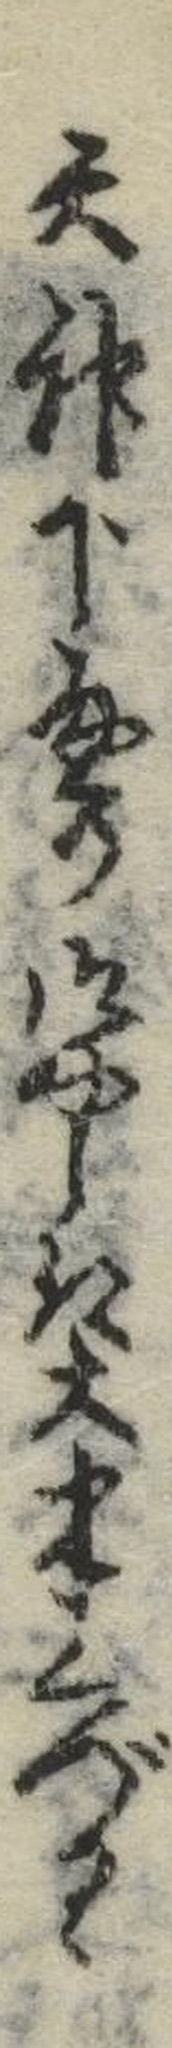天神下通り御やしき大半くづるゝ
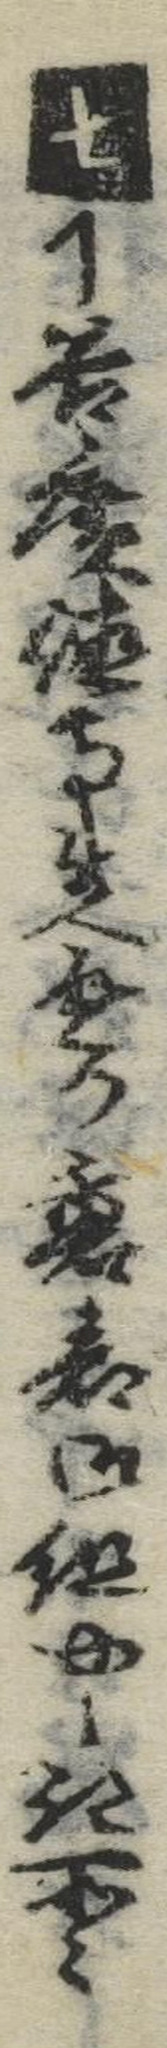七下谷広徳寺まへ通り裏表御組やしき所々
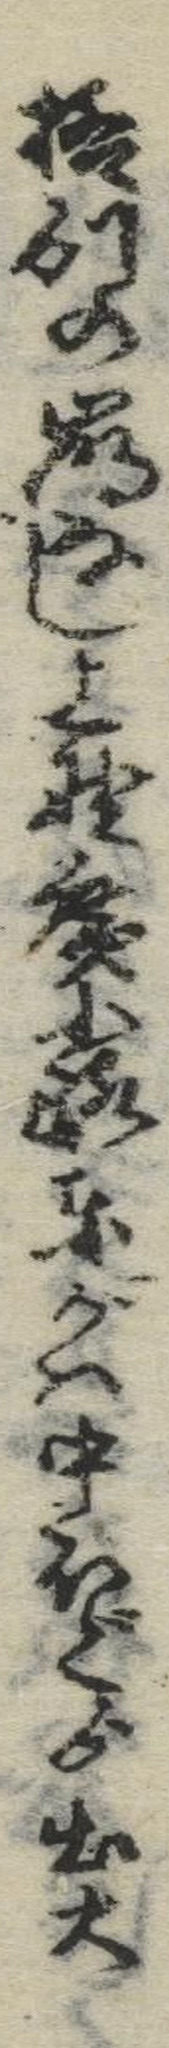格別の崩なし上野広小路東がハ中ほどゟ出火
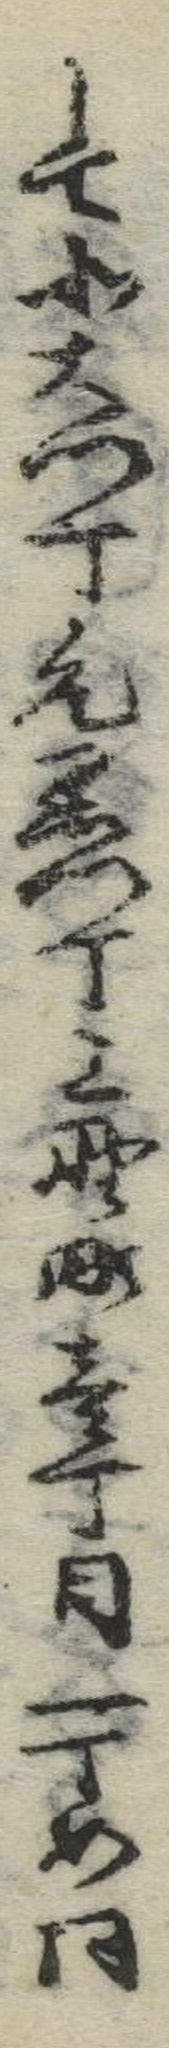して北大門丁元黑門丁上野町壱丁目一丁め同
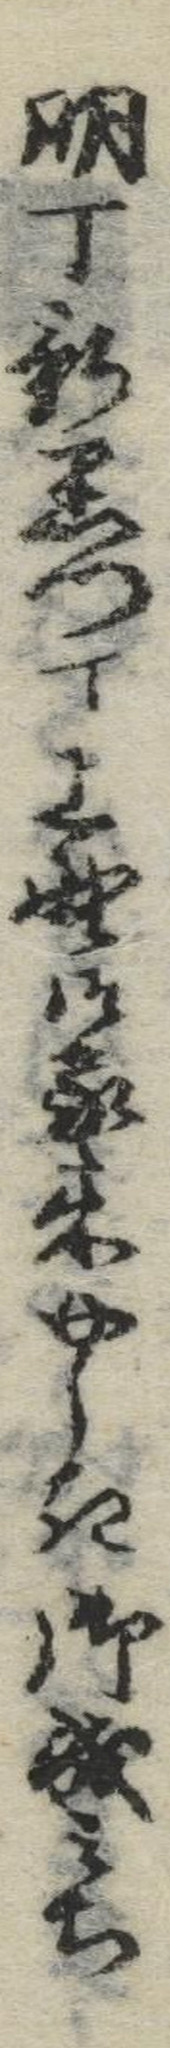朋丁新黒門丁上野御家来やしき御成ミち
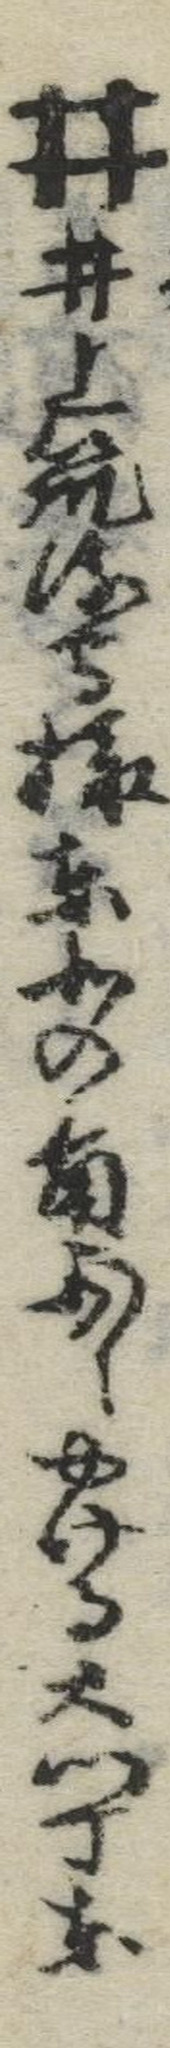井一万石井上筑後守様東北の角少しやける大門丁車
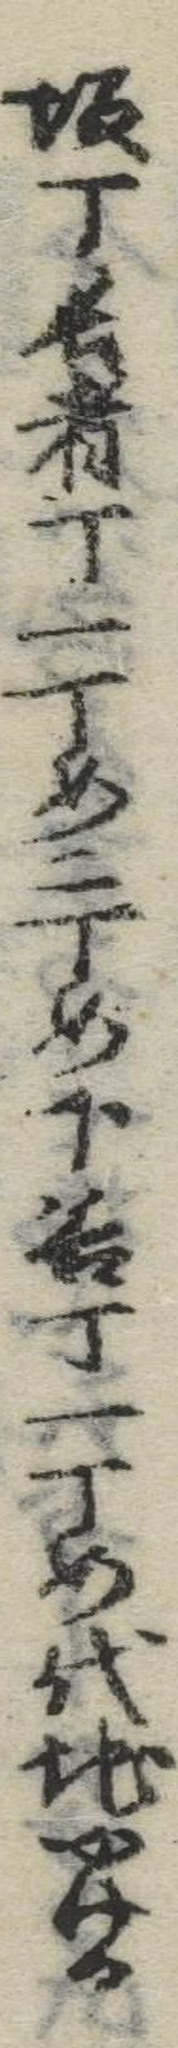坂丁長者丁一丁め二丁め下谷丁一丁め代地やける
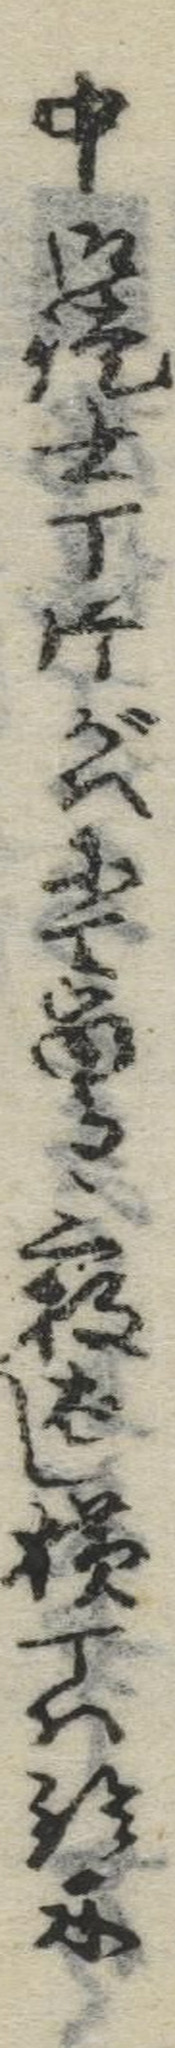中御徒士丁片がハにて留る三枚ばし横丁ハ鈴木
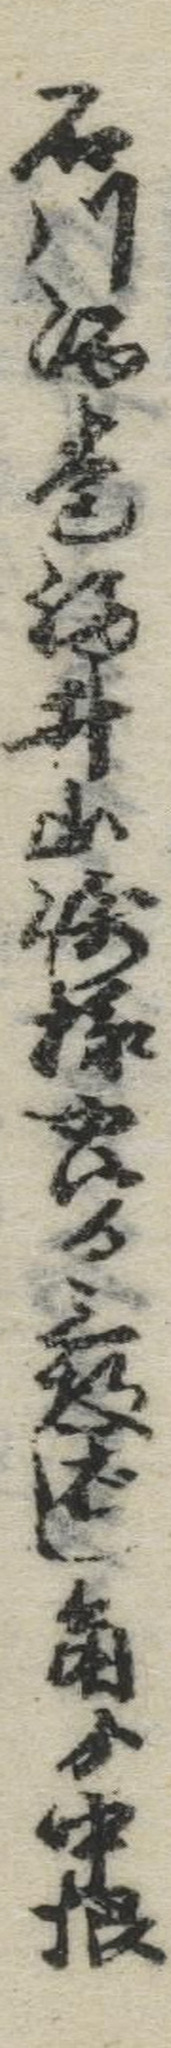石川酒巻福井山崎様やける三枚ばし角ゟ中根
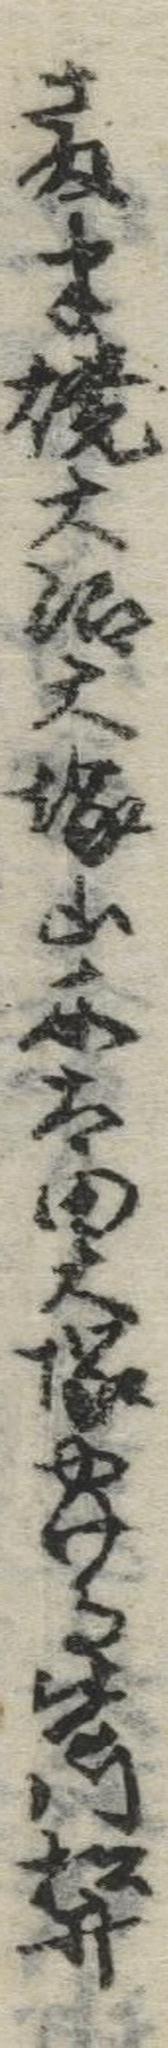さま半焼大沼大塚山本大田大塚やける皆川松井
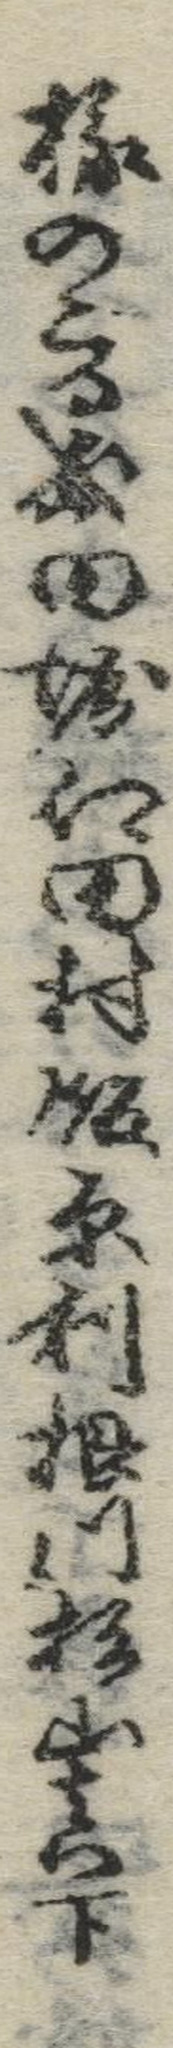様のこる成田堀江田村飯原利根川杉山真下
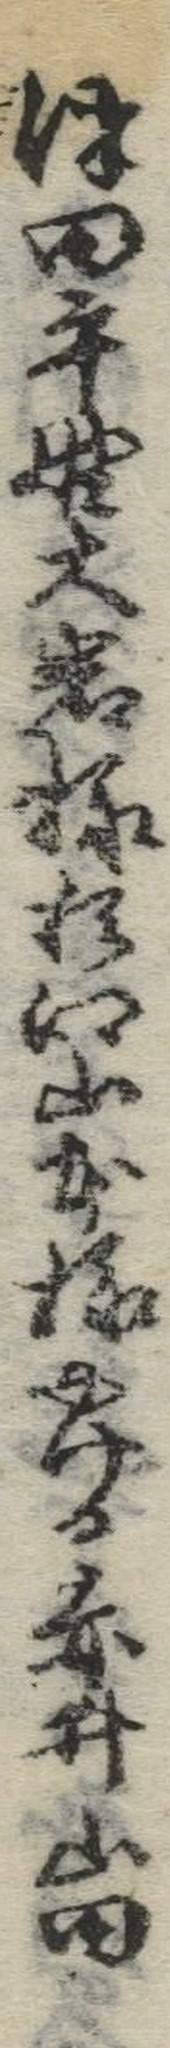津田平野大岩様杉江山本様やける赤井山田
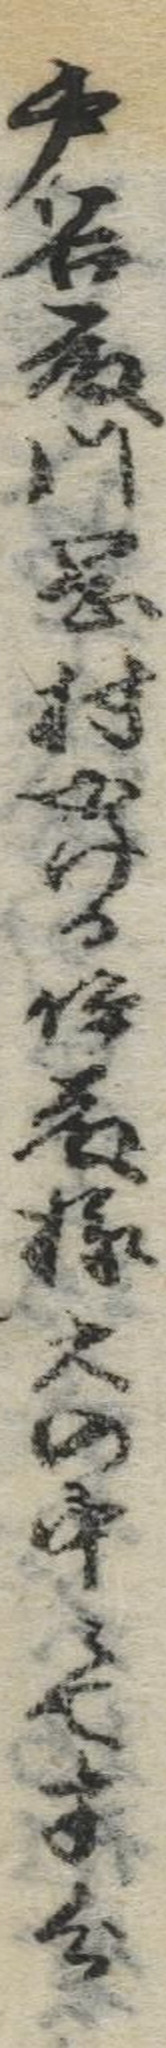戸谷藤川岡村やける伊藤様火の中にて半分
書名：安政二卯十月二日夜四ツ時過　御府内御屋敷方市中共　地震類焼場所明細書之寫　并街道筋近郷聞書
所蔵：東京大学地震研究所図書室 Earthquake Research Institute Library, The University of Tokyo, JAPAN
